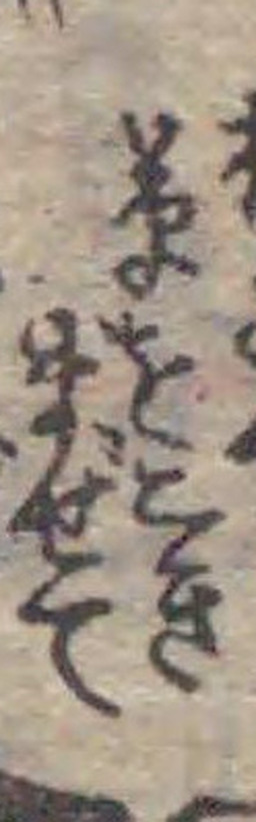まぜて
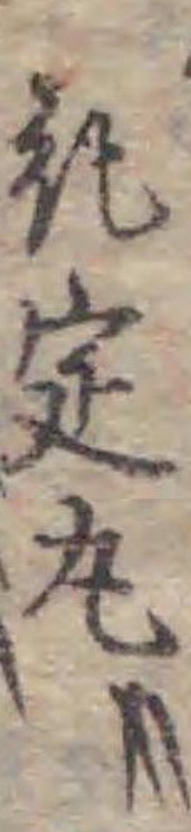紀定丸
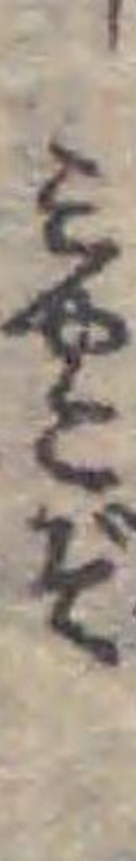みやこぞ
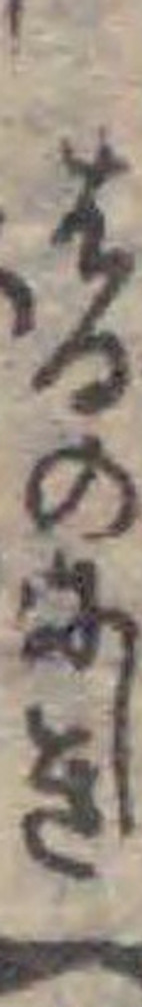はるのにしき
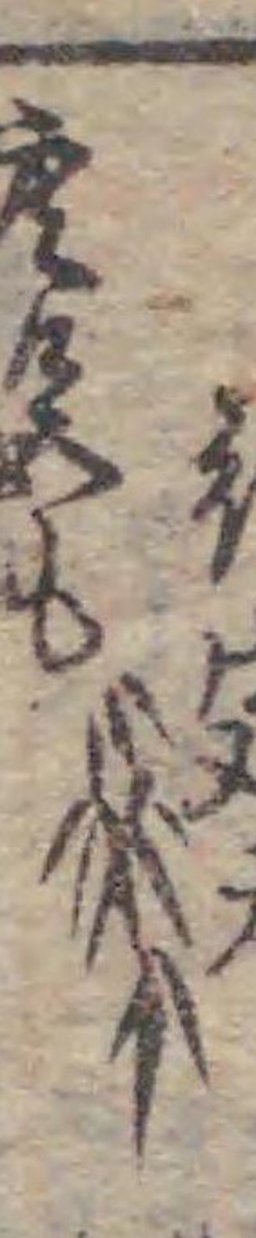空色も
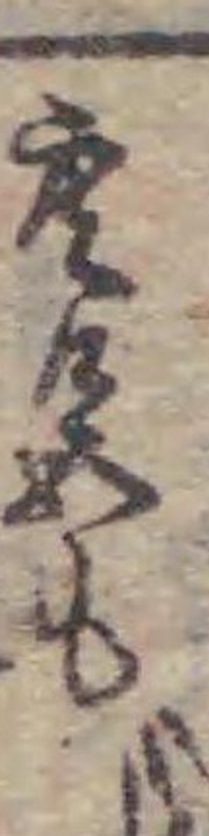空色も
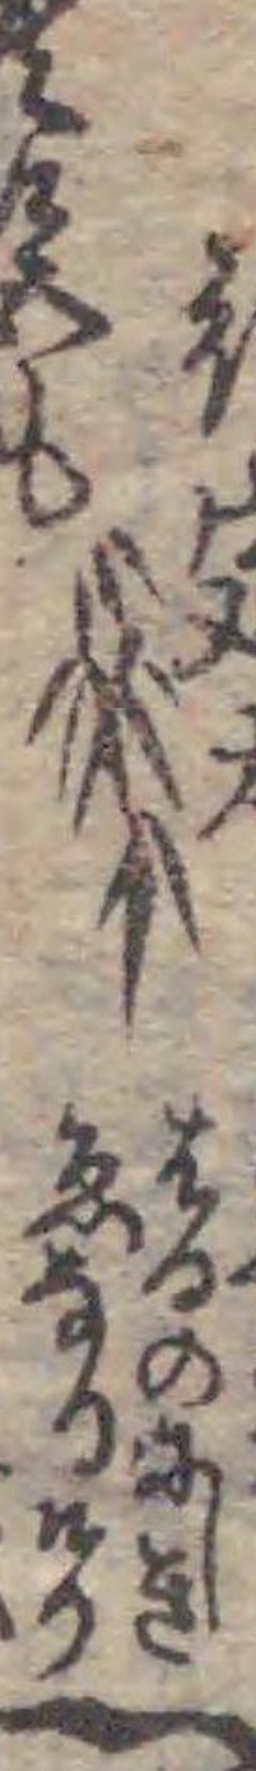ゑなりけり
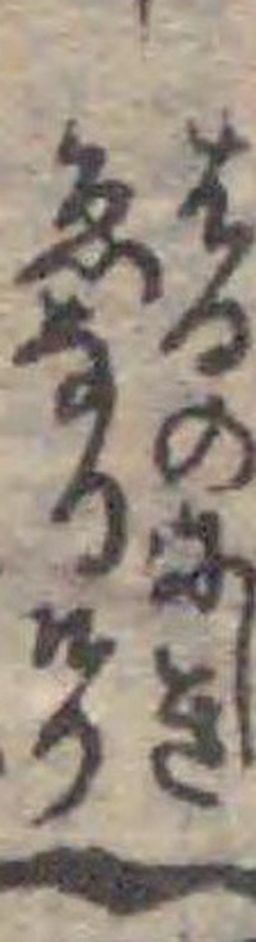ゑなりけり
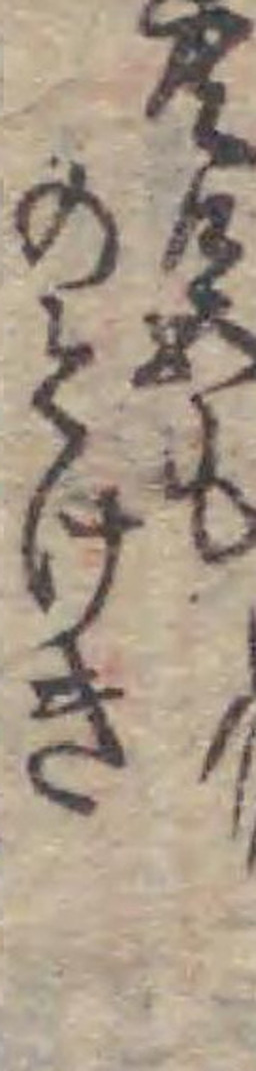のとけき
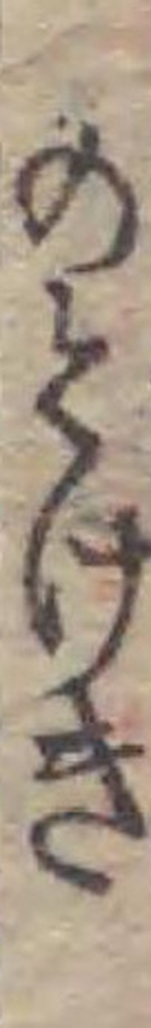のとけき
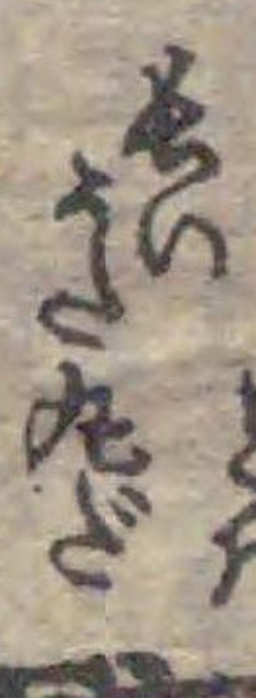うた丸だ
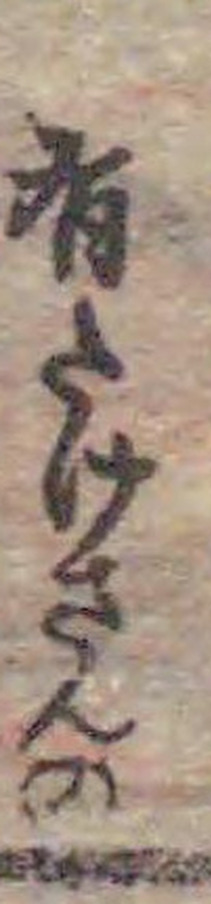有たけさんの
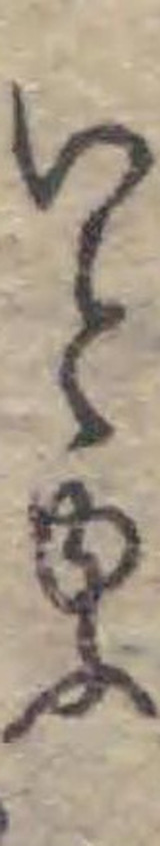いとゆふ
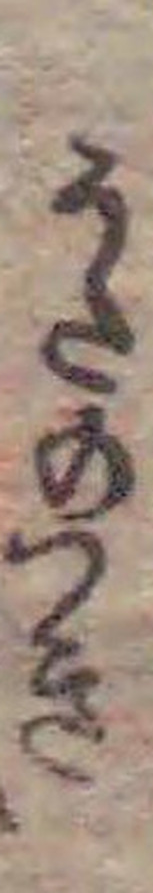うたのつき
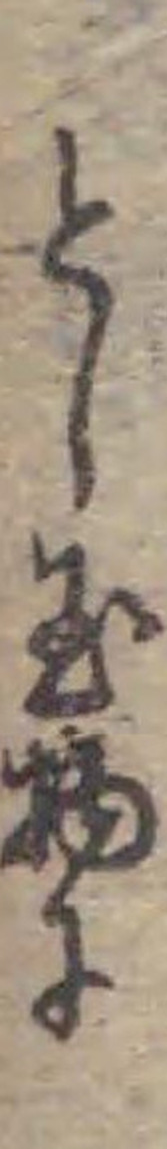とし玉物に
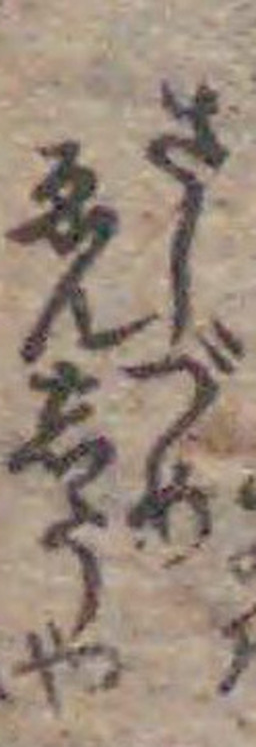ゑんしうや
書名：年始御礼帳 : 3巻
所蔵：国立国会図書館 National Diet Library, JAPAN
